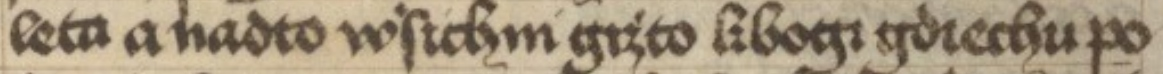leta a nadto wẛichni giżto kbogi gdiechu po-
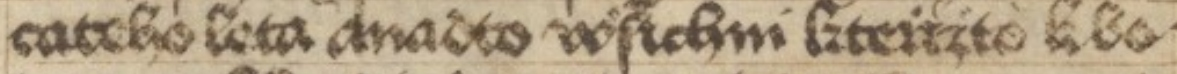cateho leta anadto wẛichni kteṙiżto kbo-
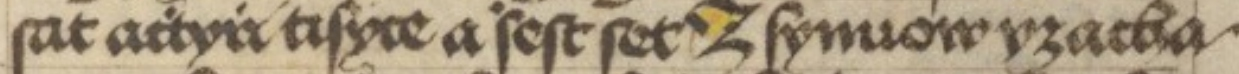ſat aċtyṙi tiſyce a ẛeſt ſet Zſynuow yzacha-
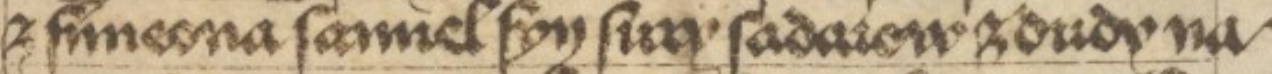z ſimeona ſamiel ſyn ſury ſadaiow zdudy na
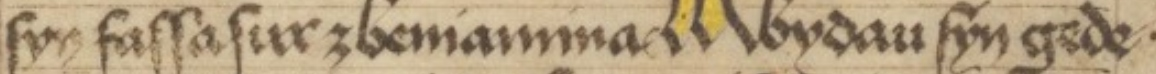ſyn faſſaſur z beniamina Wbydau ſyn gede=
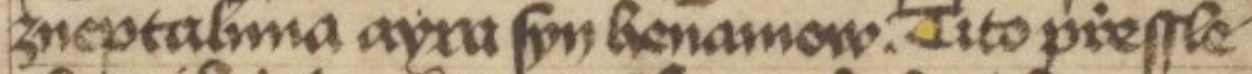zneptalima ayra ſyn henamow. Tito pṙeſſle-
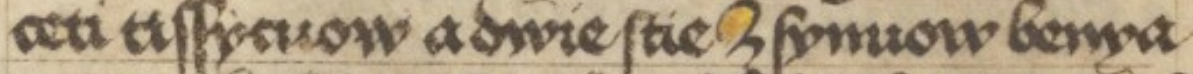ceti tiſſycuow a dwieſtie Zſynuow benya-
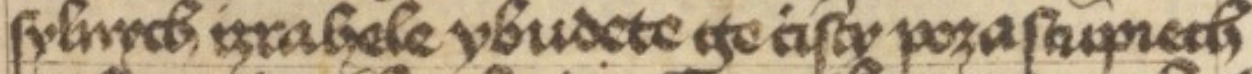ſylnych izrahele ybudete ge ċiſty pozaſtupiech
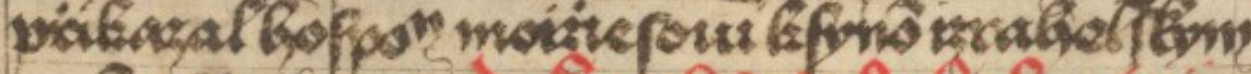pṙikazal hoſpon moiżieſoui kſynȏ izrahelſkym
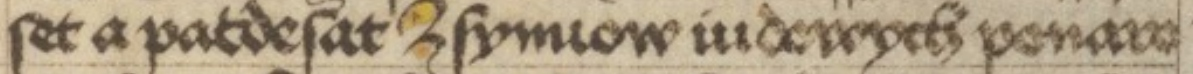ſet a patdeſat Zſynuow iudowych ponaro-
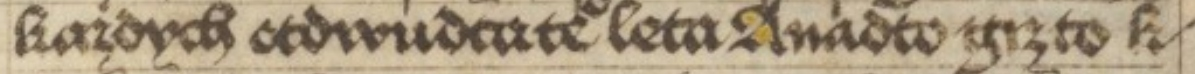každych otdwudcate° leta Anadto gizto k
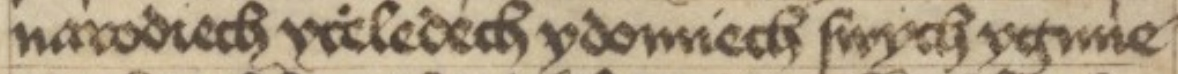narodiech yċeledech ydomiech ſwych ygmie-
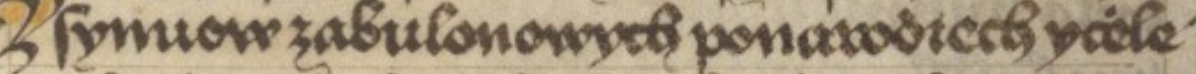Yſynuow zabulonowych ponarodiech yċele-
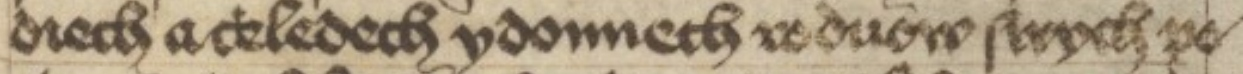diech a ċeledech ydomiech roduow ſwych po-
